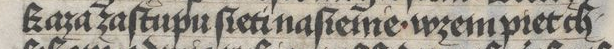kaza zaſtupu ſieti naſieme.wzem piet ch¬
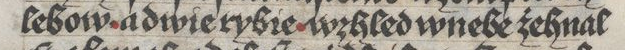lebow.a dwie rybie.wzhled wnebe żehnal
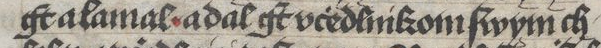ḡt a lamal.a dal ḡt vċedlníkom ſwym ch¬
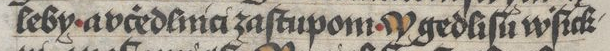leby.a vċedlníci zaſtupom.Y gedli ſu wẛick¬
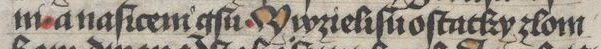ni.a naſiceni gſu.Y wzieli ſu oſtatky zlom¬
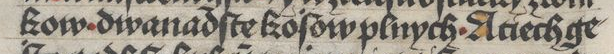kow.dwanadſte koẛow plnych.A tiech ge¬
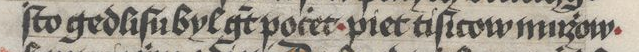ẛto gedliſu byl ḡt poċet.piet tiſicow mużow.
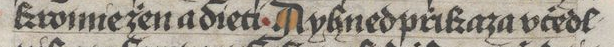kromie żen a dieti.A yhned pṙikaza vċedl¬
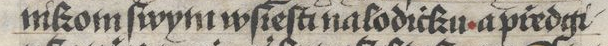nikom ſwym wſieſti na lodiċku.a pṙedgi¬
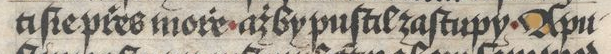ti ſie přes moṙe.aż by puſtil zaſtupy.Apu¬
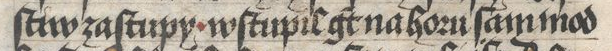ſtiw zaſtupy.wſtupil ḡt na horu ſam mod¬
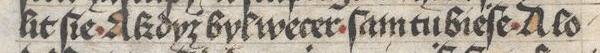lit ſie.Akdyž byl wecer.ſam tu bieẛe.A lo¬
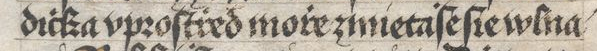diċka vproſtṙed moṙe zmíetaẛe ſie wlna¬
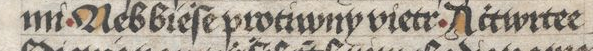mi.Neb bíeẛe protiwny vietr.A ċtwrtee
